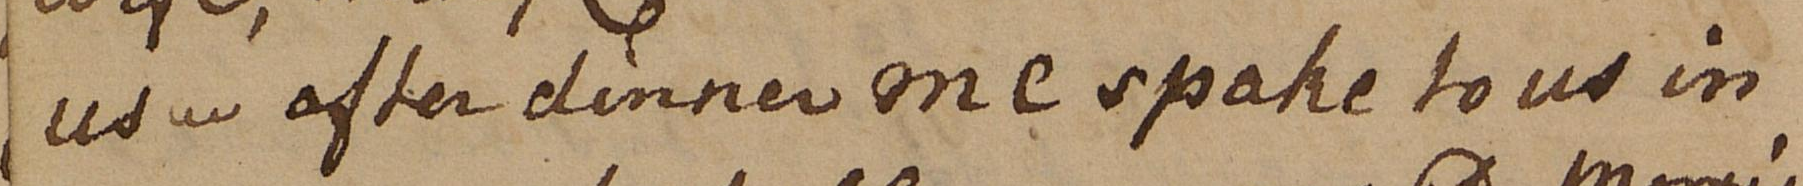us- after dinner MC spake to us in
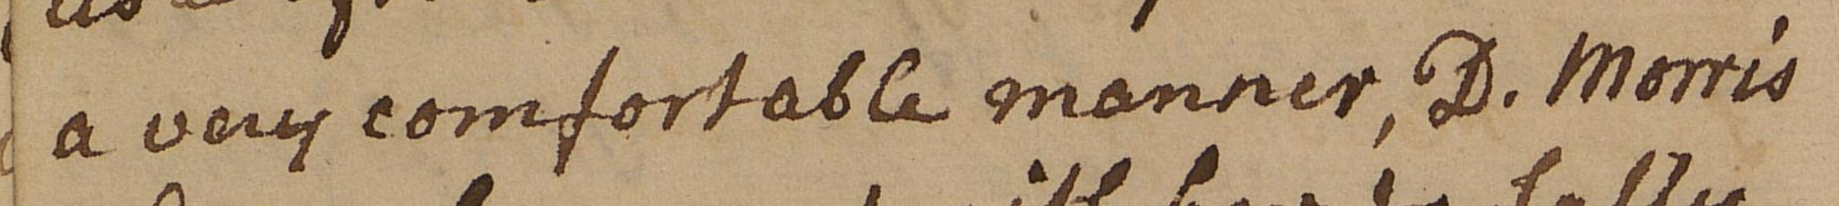a very comfortable manner, D. Morris
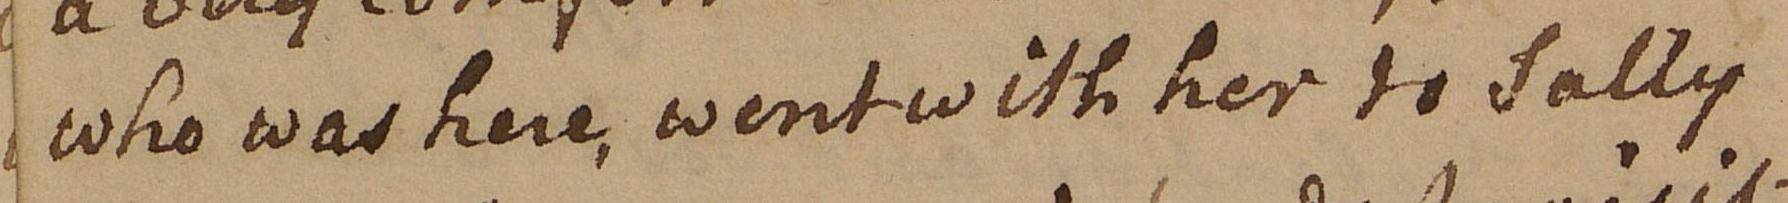who was here, went with her to Sally
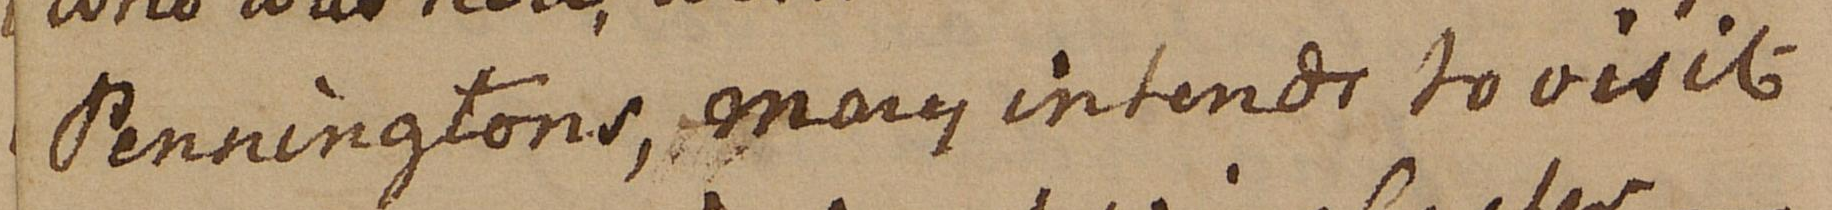Penningtons, Mary intends to visit
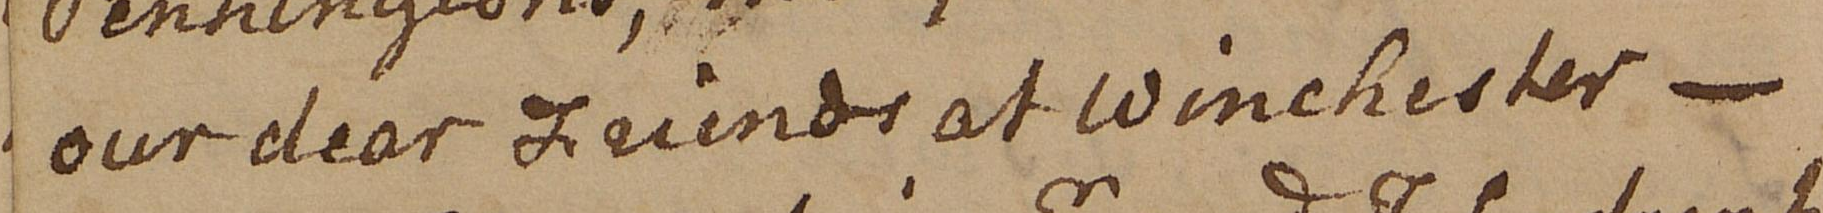our dear Friends at Winchesher-
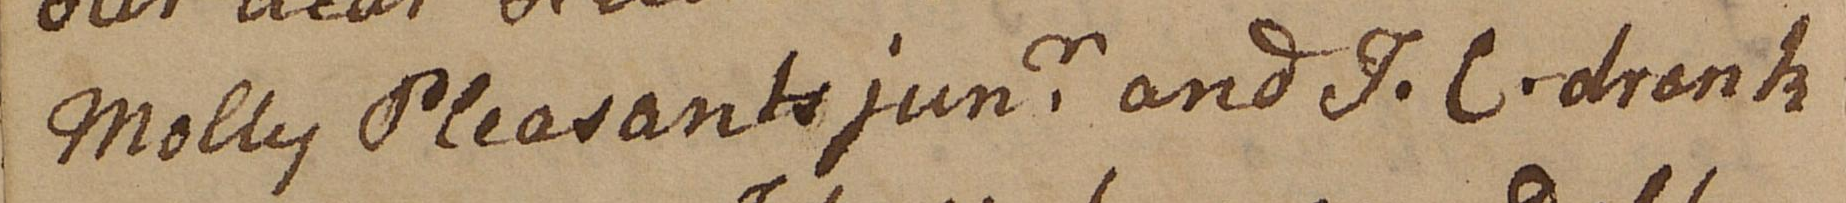Molly Pleasants jun^r. and J.C. drank
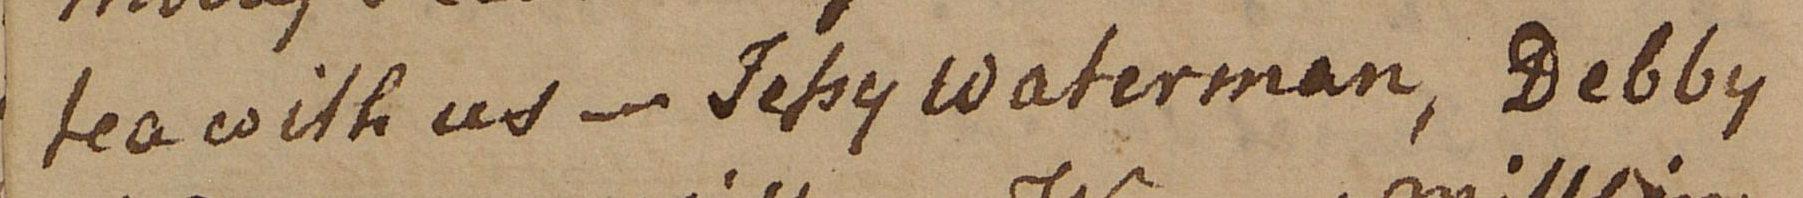tea with us- Jessy Waterman, Debby
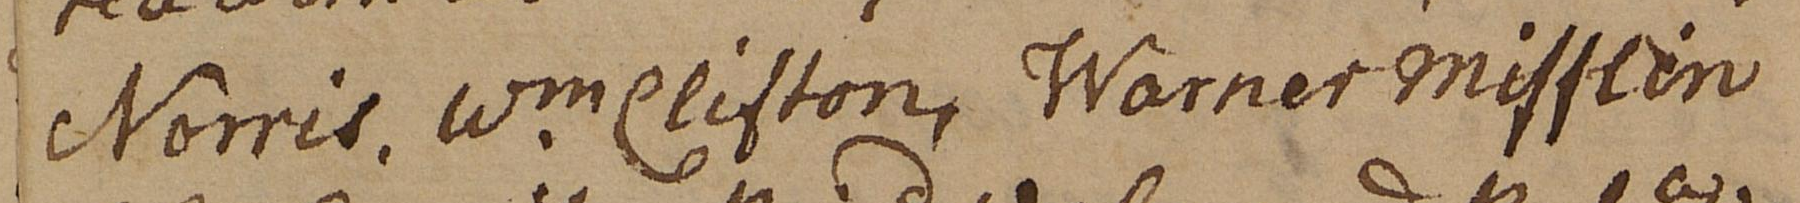Norris, W^m. Clifton, Warner Mifflin
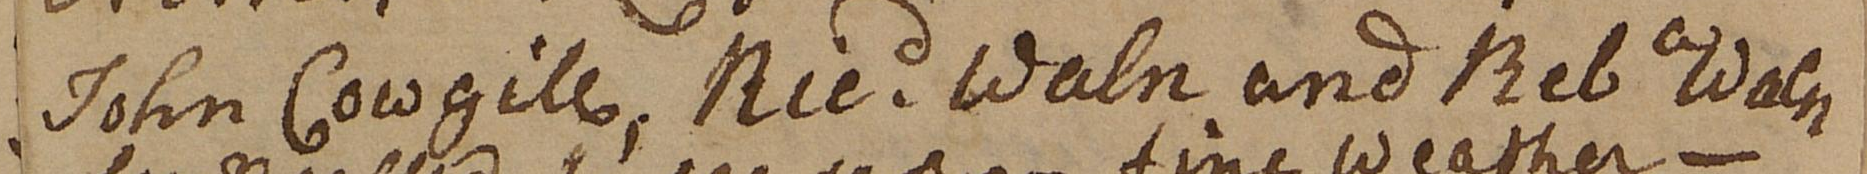John Cowgill, Rid^d. Waln and Reb^a Waln
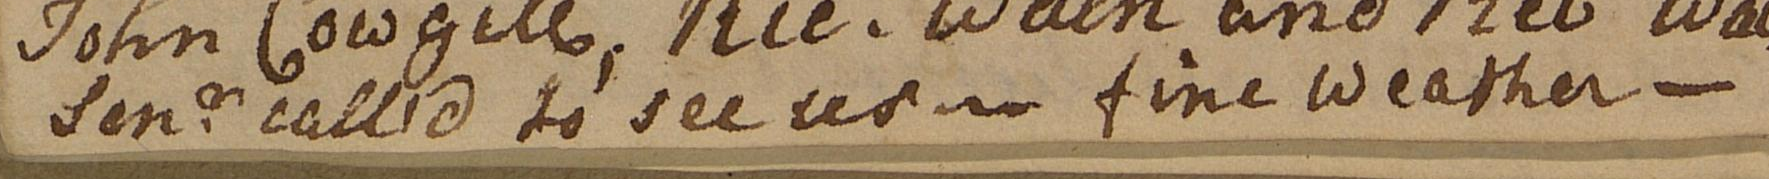Sen^r. call'd to see us- fine weather-
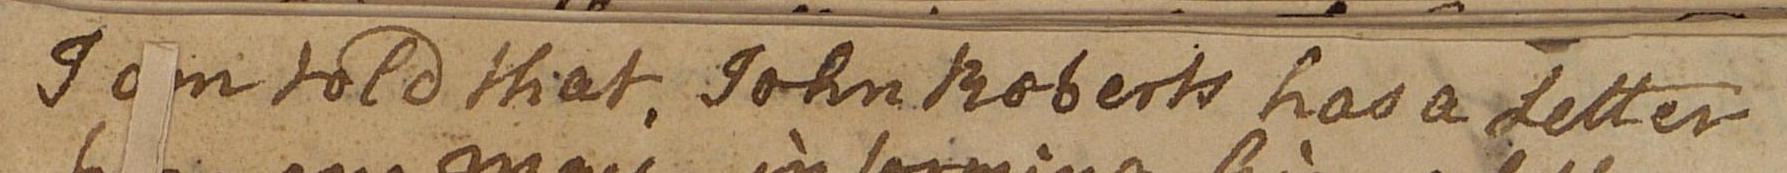I am told that John Roberts has a Letter
